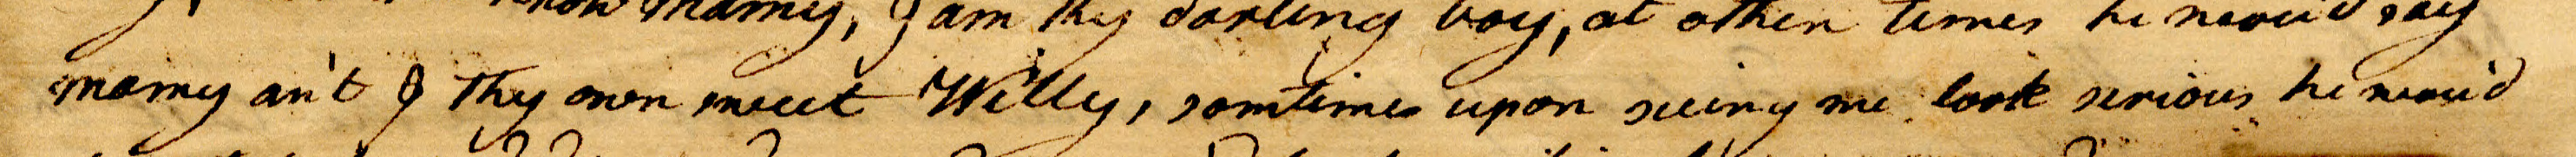mamy an't I thy own sweet Willy, sometimes upon seeing me look serious he wou'd
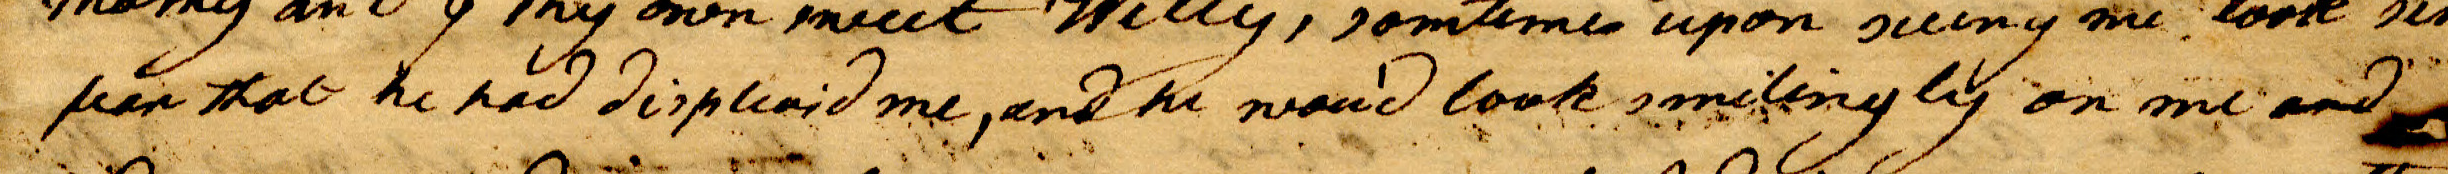fear that he had displeas'd me, and he wou'd look smilingly on me and
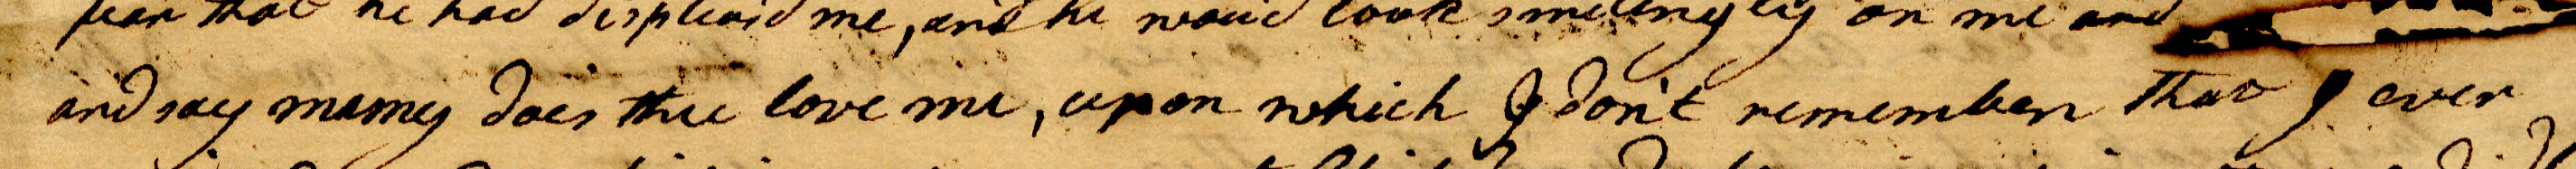and say mamy does thee love me, upon which I don't remember that I ever
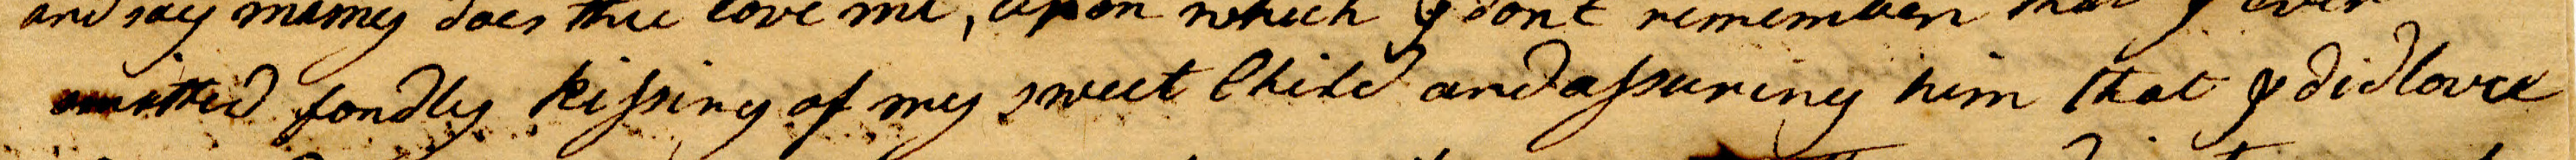smitted fondly kissing of my sweet Child and assuring him that I did love
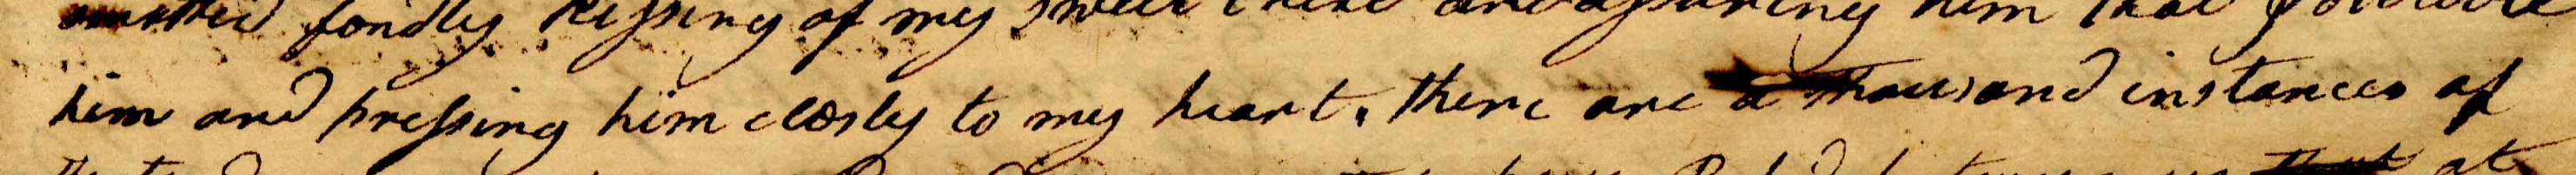him and pressing him closly to my heart, there are a thousand instances of
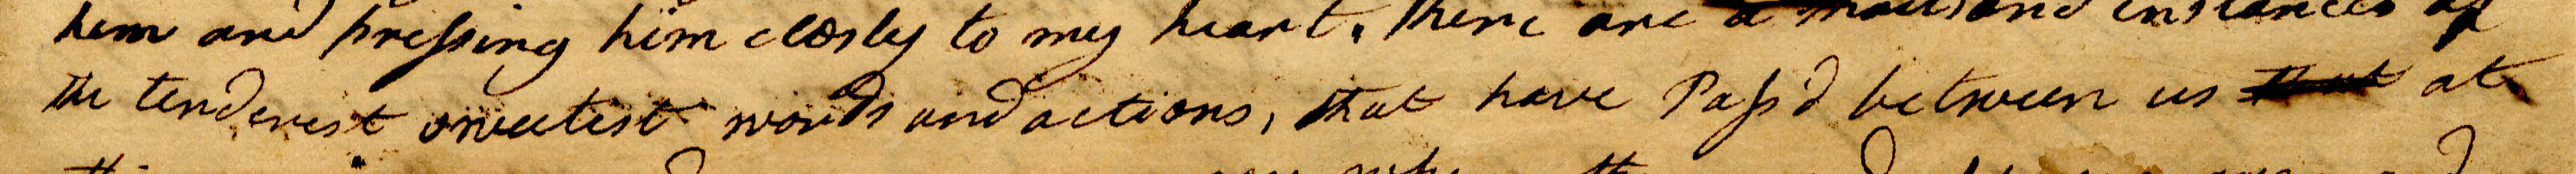the tenderest sweetest words and actions, that have Pass'd between us [that] at
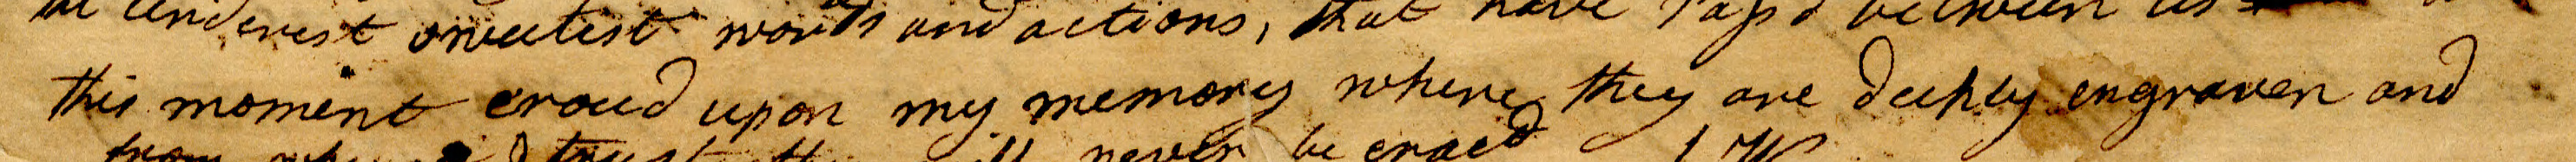this moment croud upon my memory where they are deeply engraven and
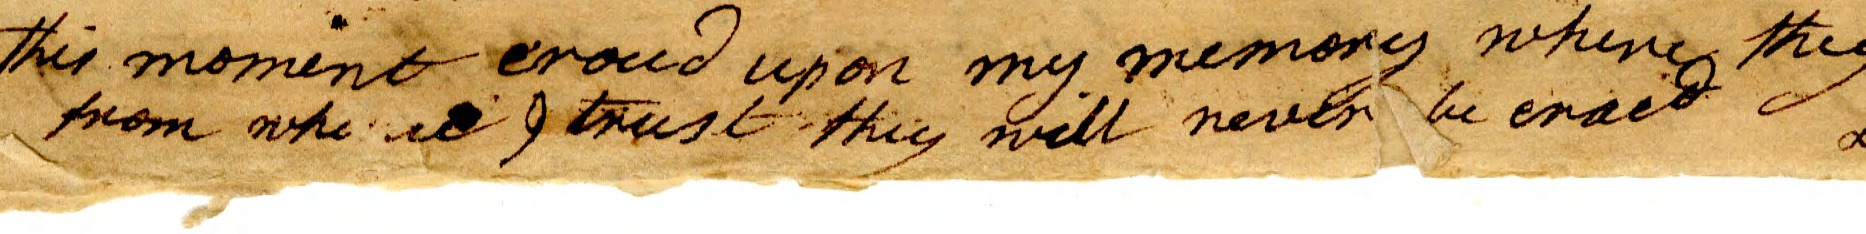from whence I trust they will never be erasd
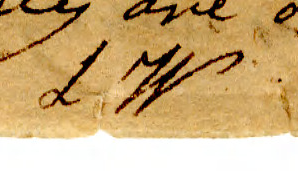LW
